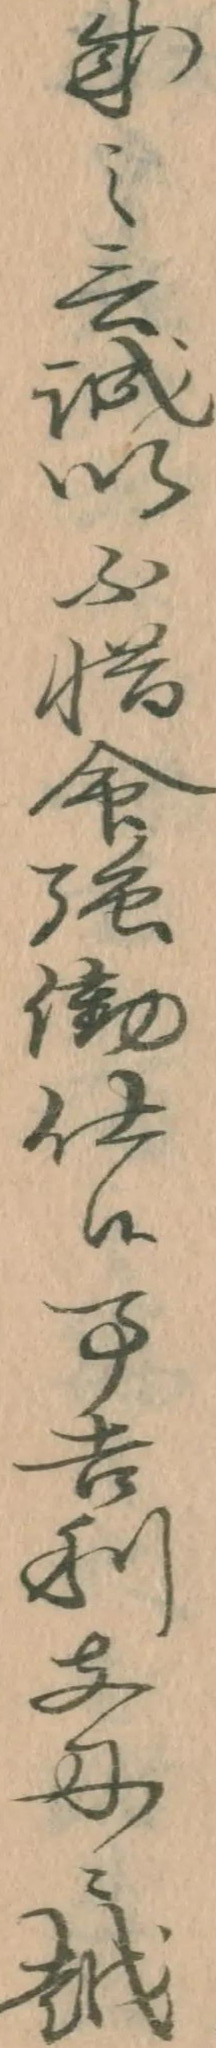成之言誠以ふ惜命強働仕候事吉利支丹に越
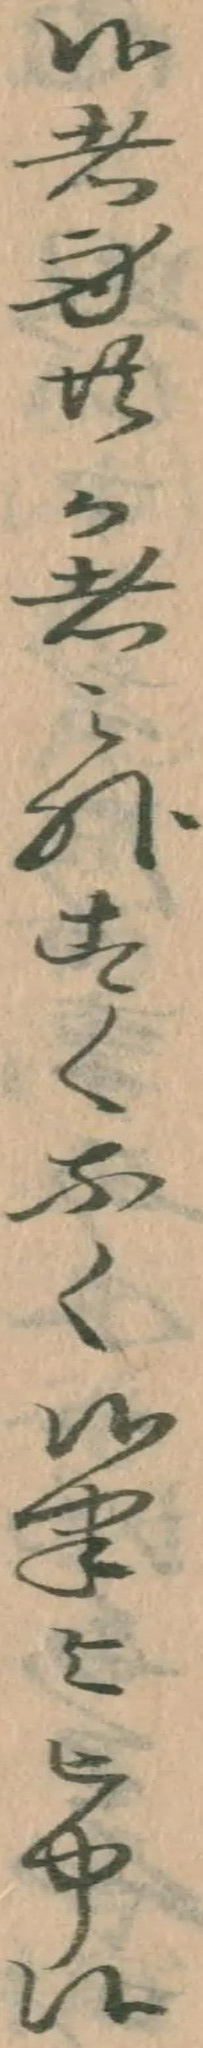候者身共か者之外春くなく候半与被申候
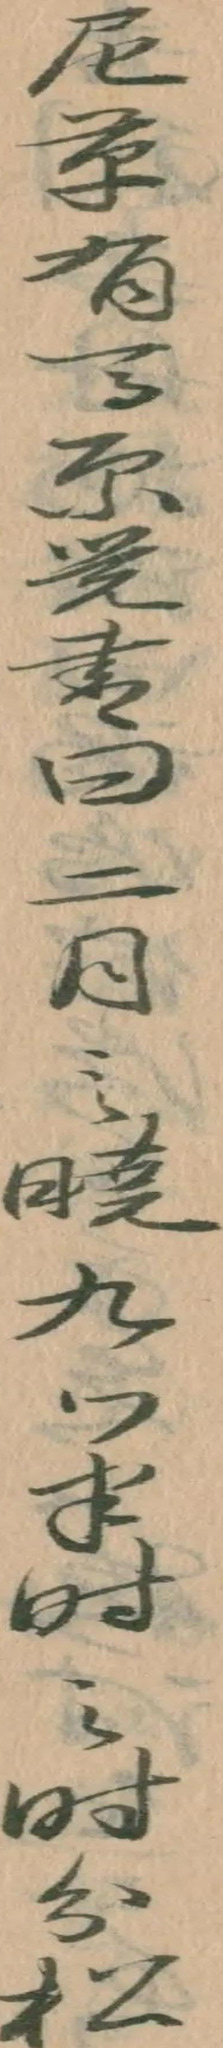尼草有馬原覚書曰二月之暁九つ半時之時分松
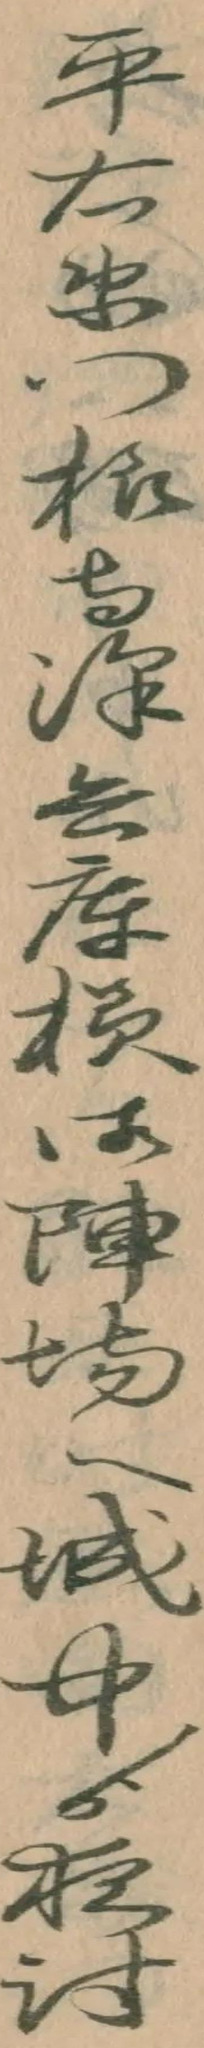平右衛門様寺沢兵庫様御陣場へ城中ゟ夜討
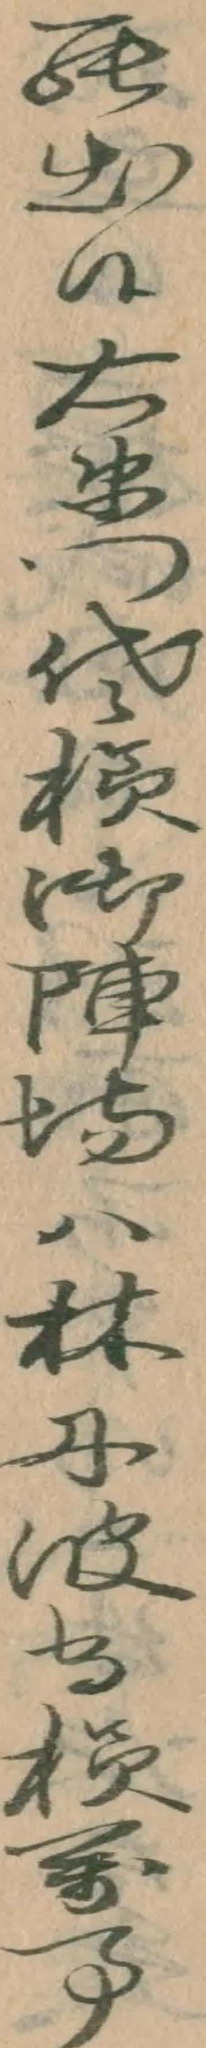罷出候右衛門佐様御陣場は林丹波守様万事
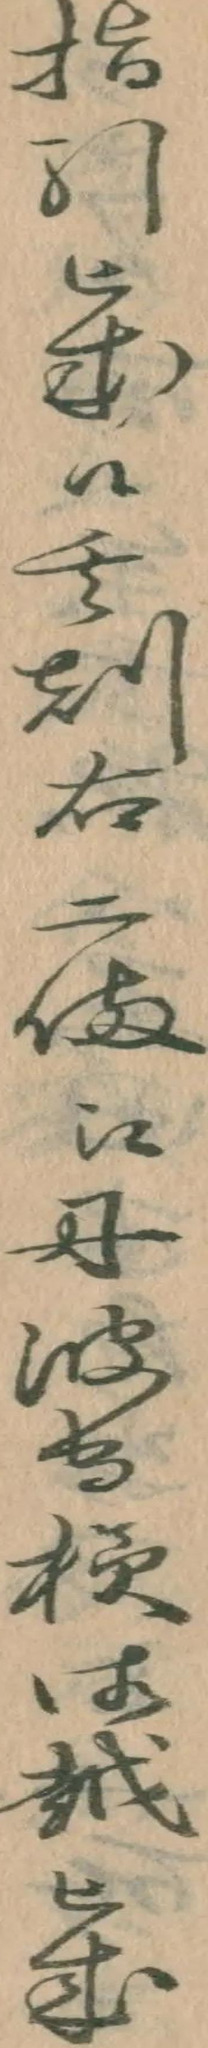指引被成候其刻右二備江丹波守様御越被成
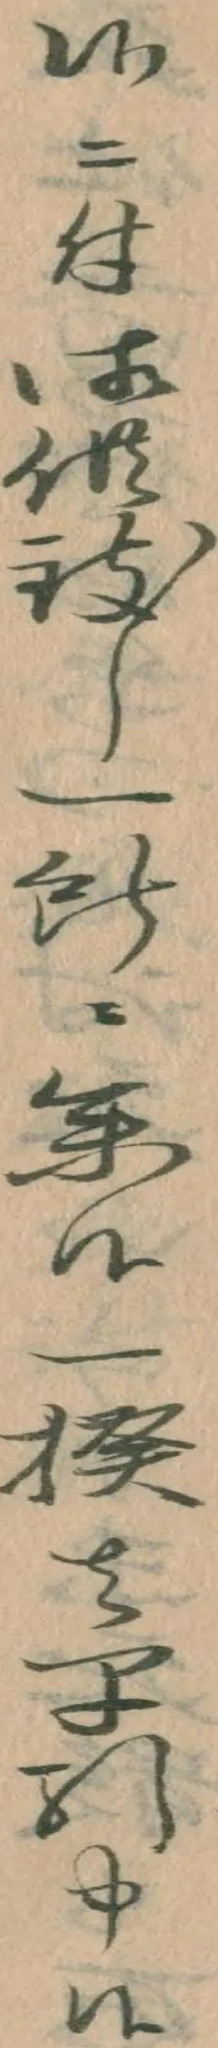候に付御供致し一所に参候一揆者早引申候
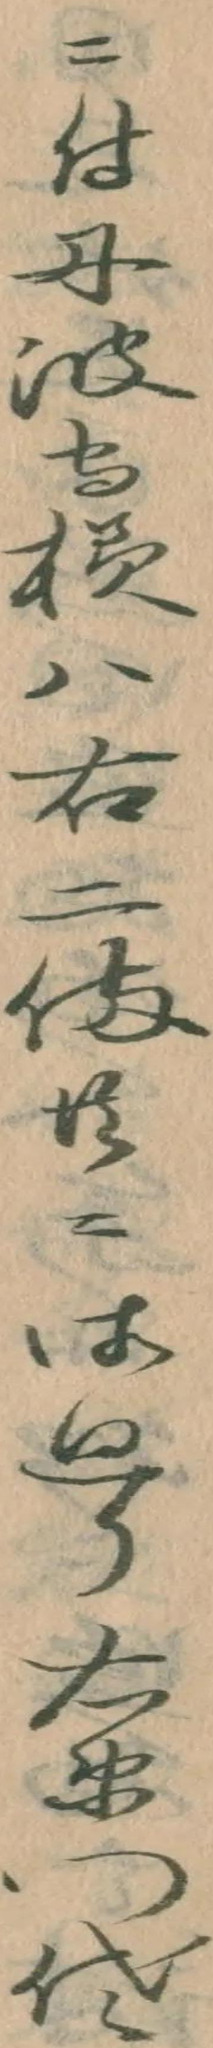に付丹波守様は右二備共に御廻り右衛門佐
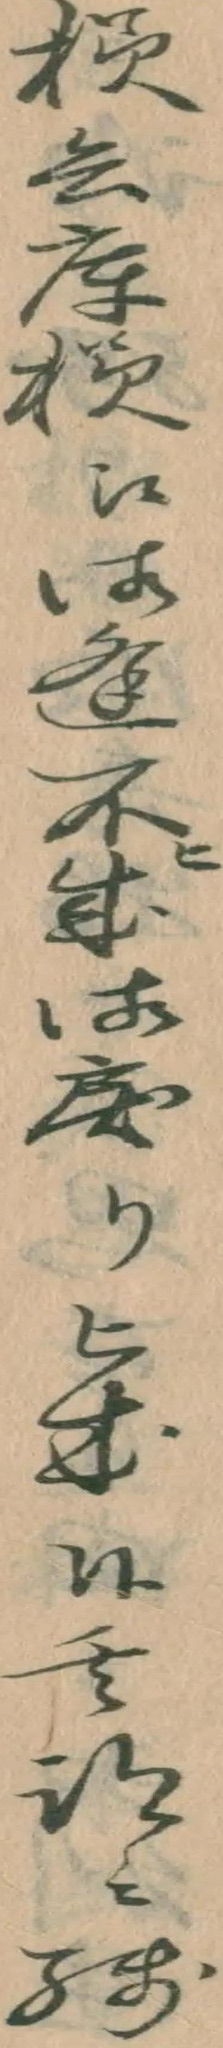様兵庫様江御逢不被成御戻り被成候其跡に残
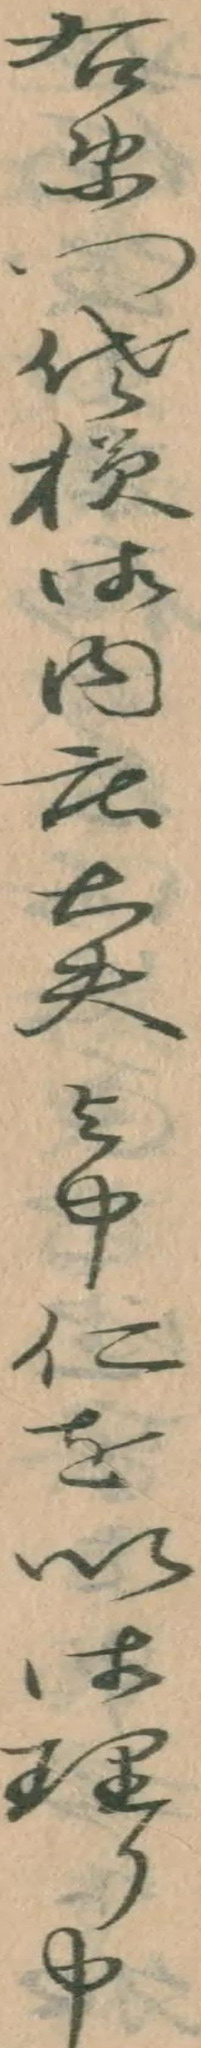右衛門佐様御内庄太夫与申仁を以御理り申
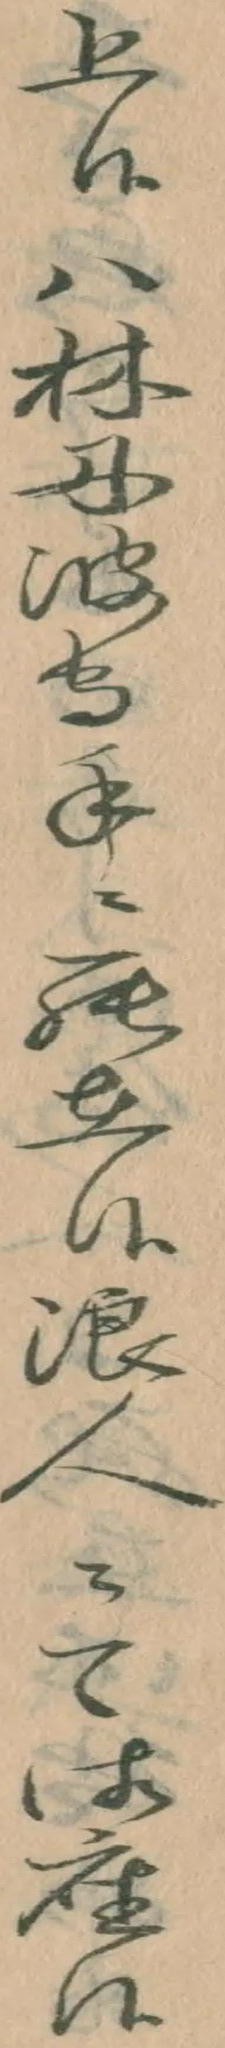上候は林丹波守手に罷在候浪人にて御座候

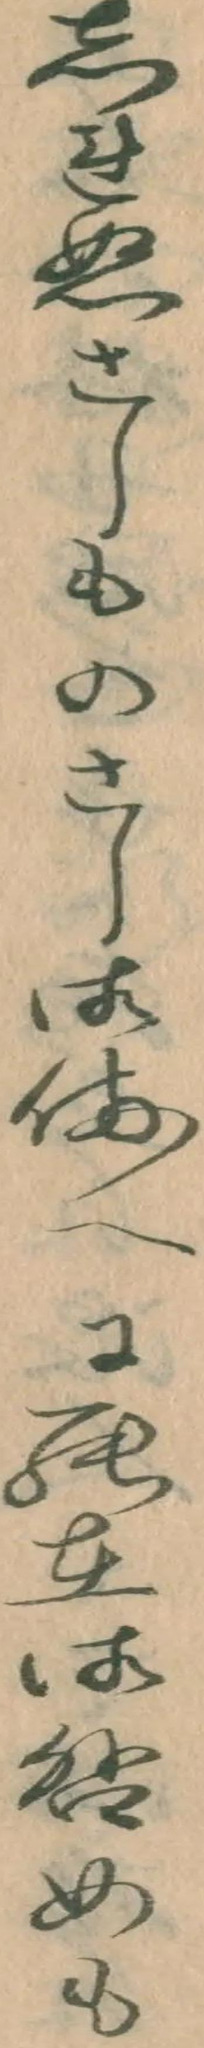者連怒さしものさし御備へ尓罷在御咎めも
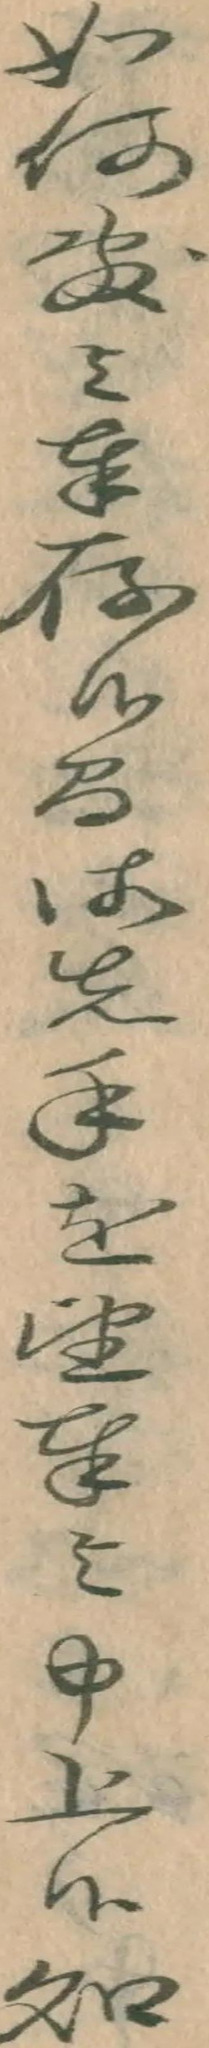如何敷与奉存候間御先手を望奉与申上候処
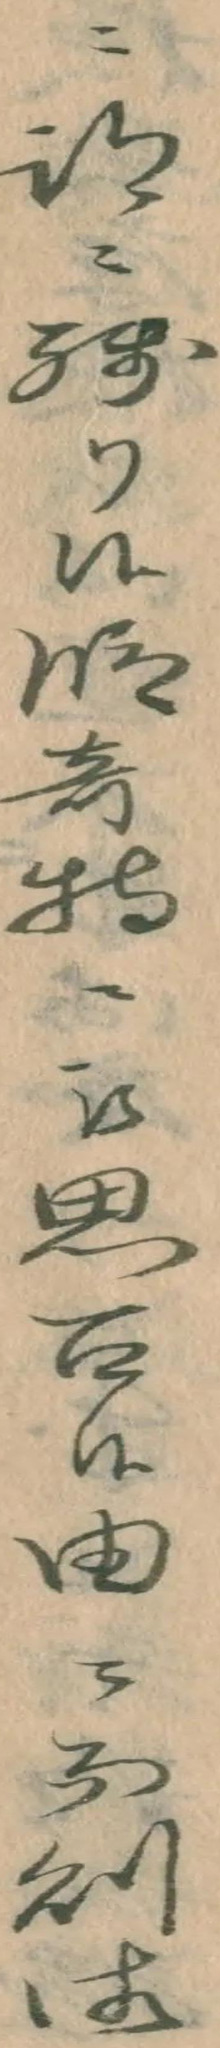に跡に残り候段奇特に被思召候由に而則御
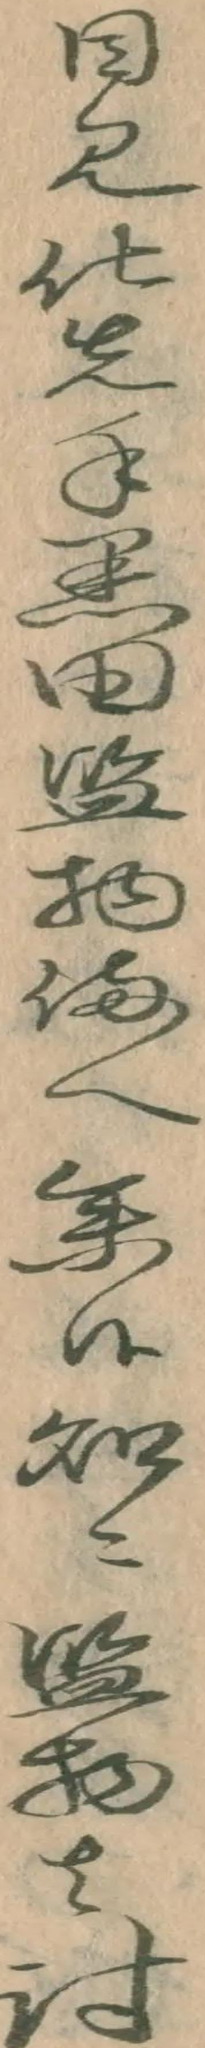目見仕先手黒田監物備へ参候処に監物者討
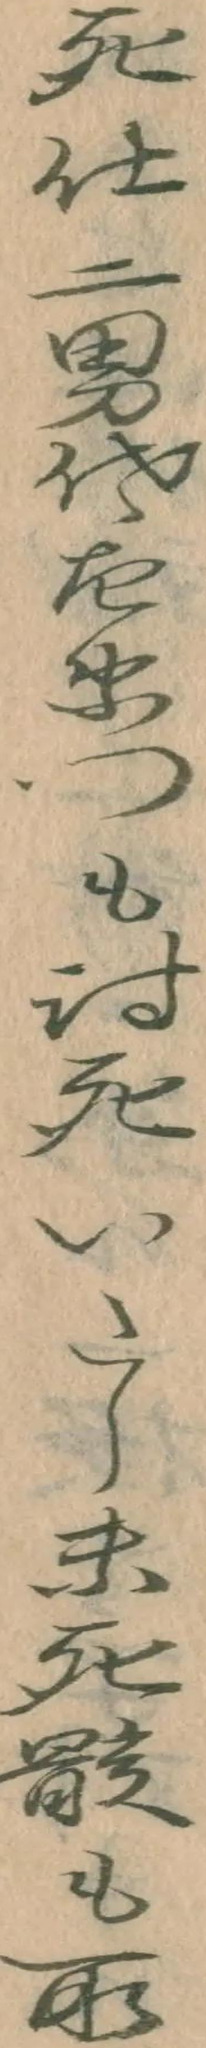死仕二男佐左衛門も討死いたし未死骸も取
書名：切支丹御退治記 49巻. [7]
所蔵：国立国会図書館 National Diet Library, JAPAN
